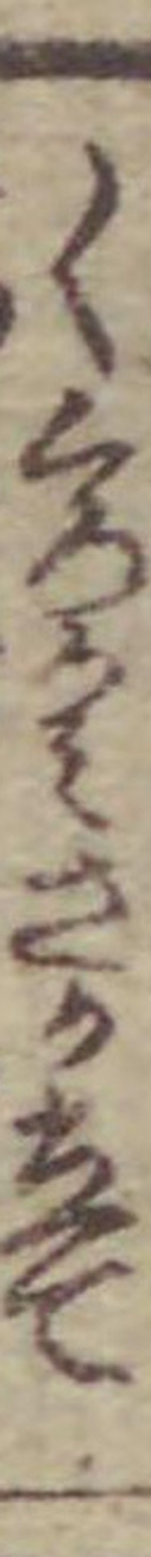〳〵くろかみさか立て
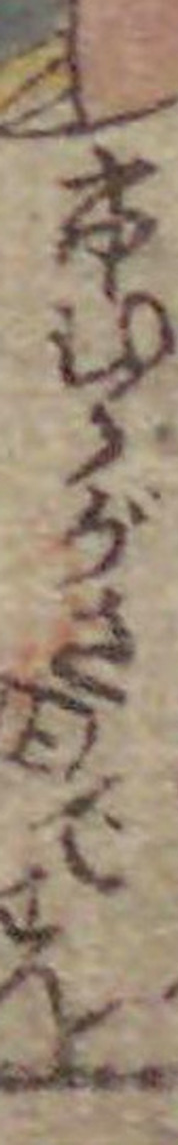市むらがさでせん
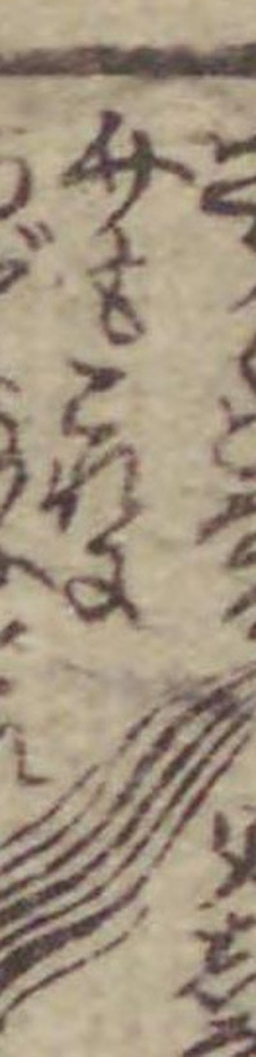介もこれに
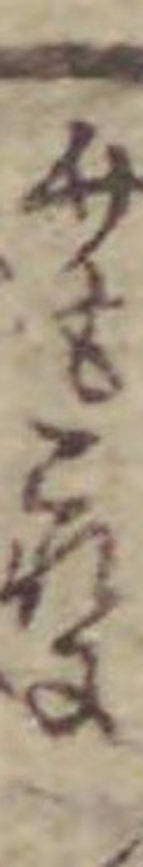介もこれに
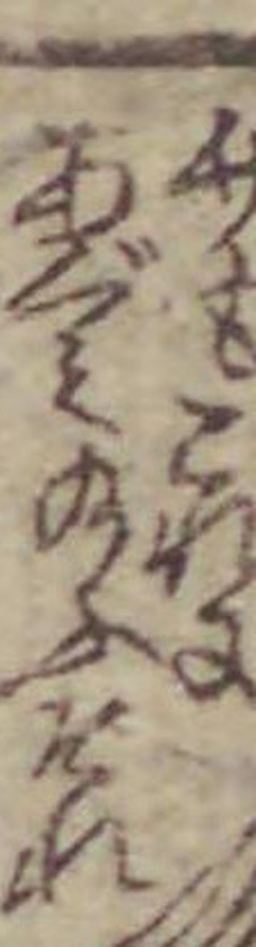あぐみ給うそれ
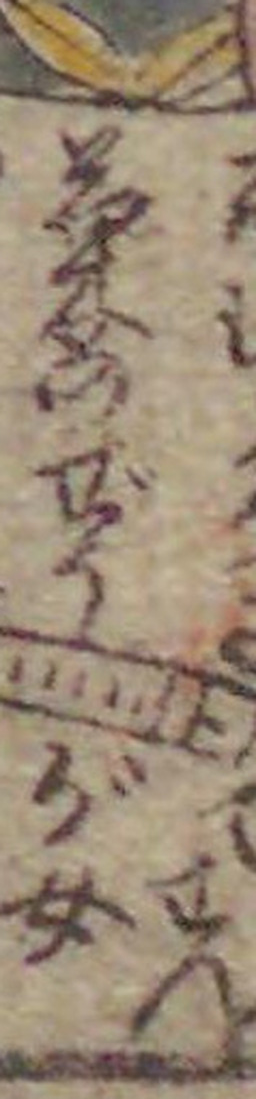菊のぜうが女
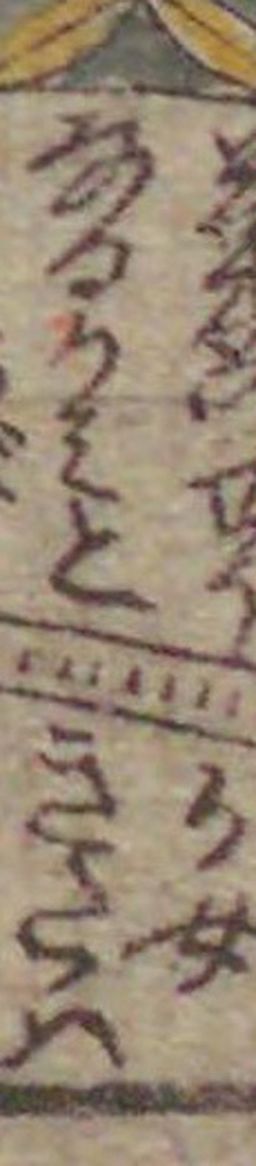なるかみときたは
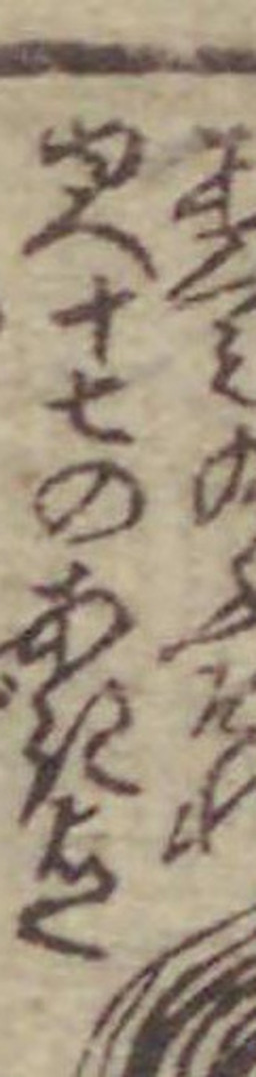ゆへ十七のあき迄
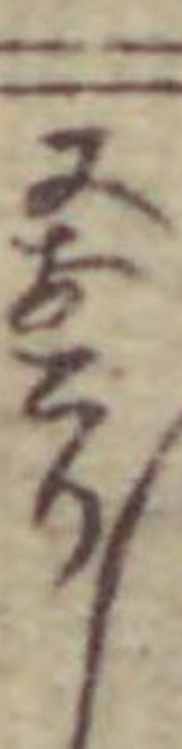又おこり
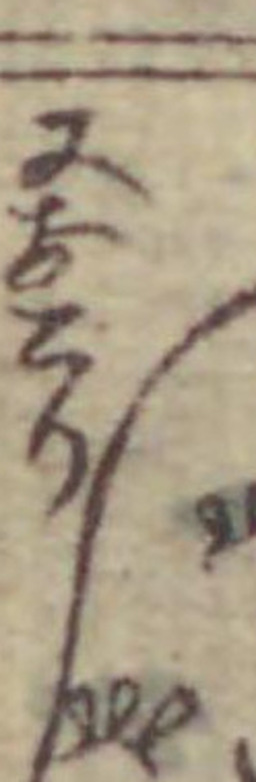又おこり
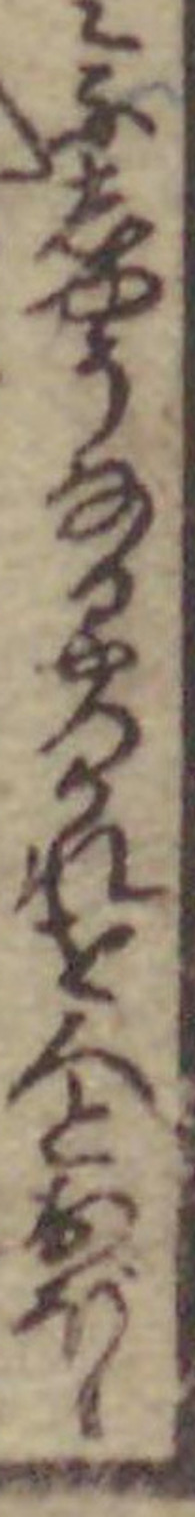みふしやうなるやつかれを人とおぼし
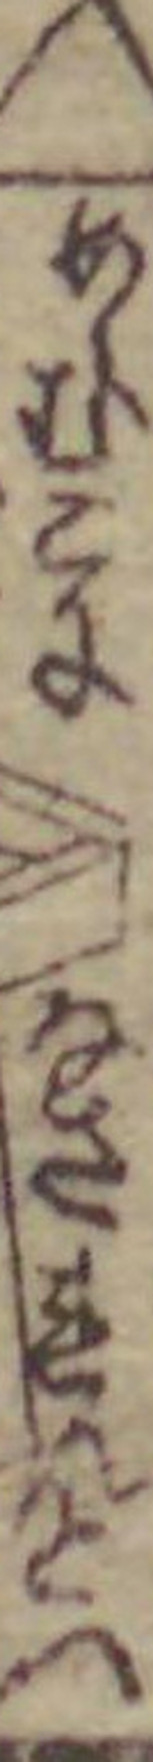めしむこになされんとは
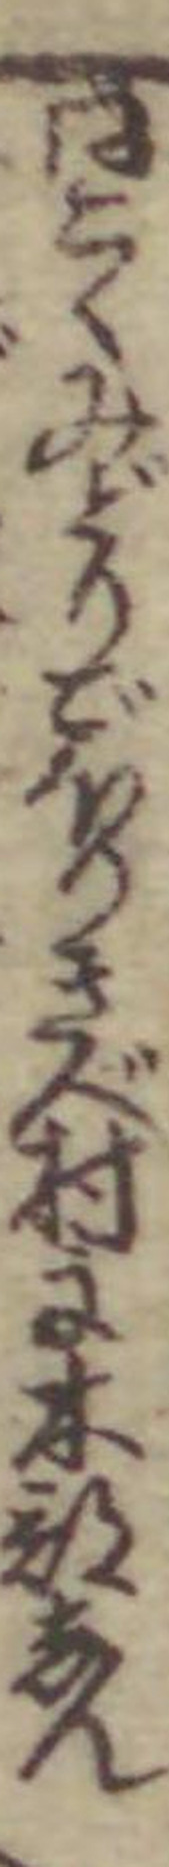同こくみどりごほりきべ村に木部しん
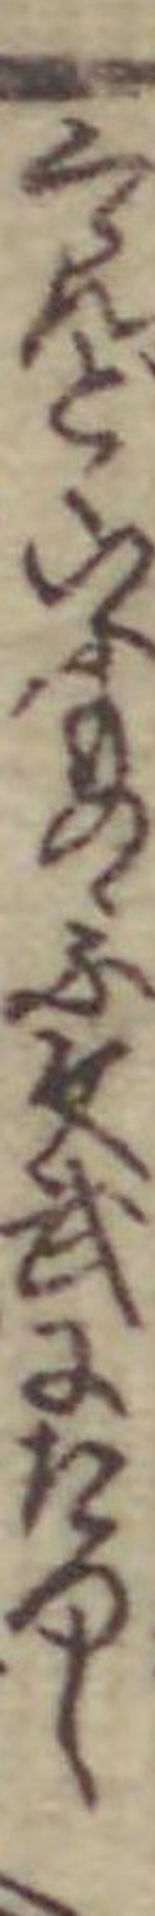くらんどゝいふもののふ文武にたつし
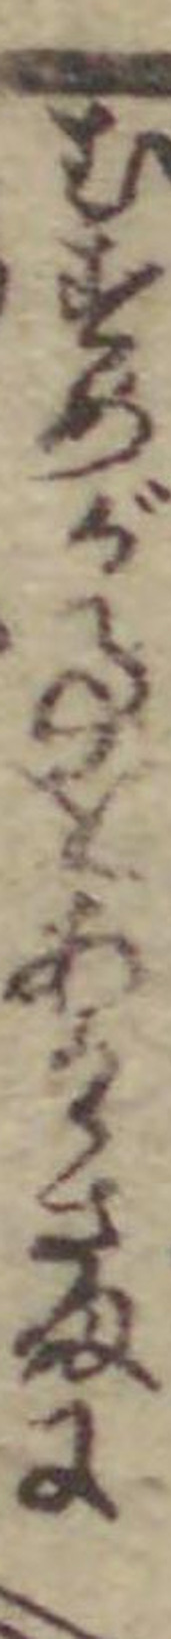むすめが事をあからさまに
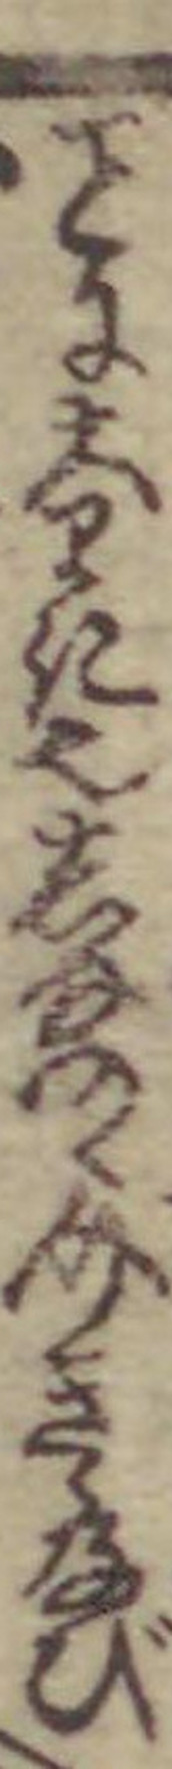ことに大りき也しなのゝ介きゝ及び
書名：娜二代鉢木 5巻
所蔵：国立国会図書館 National Diet Library, JAPAN
